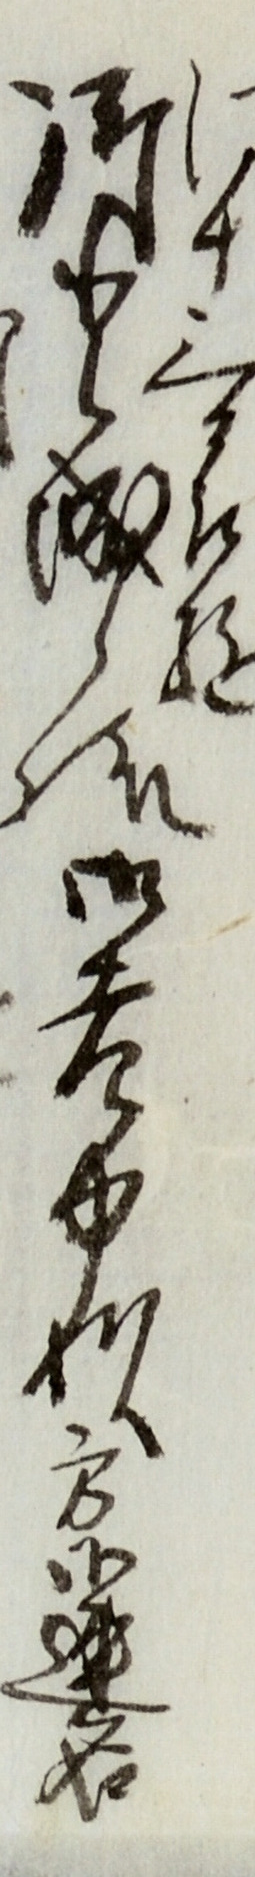御登城候様御老中様方御連名
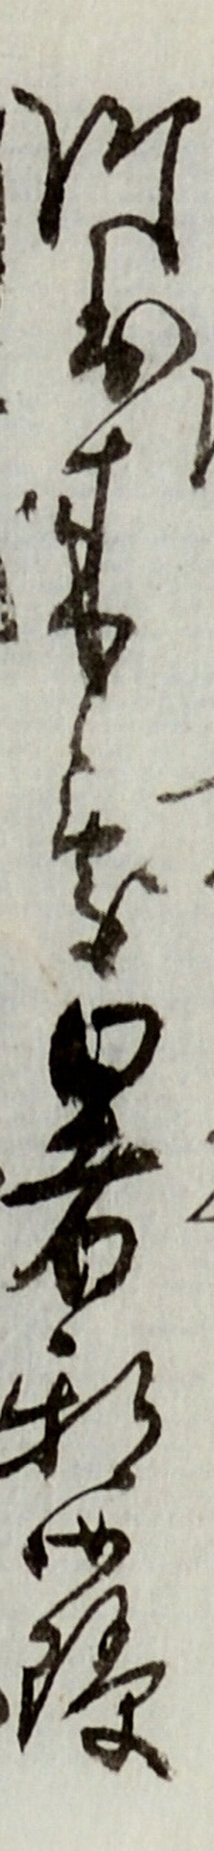御到来候処暑期御障
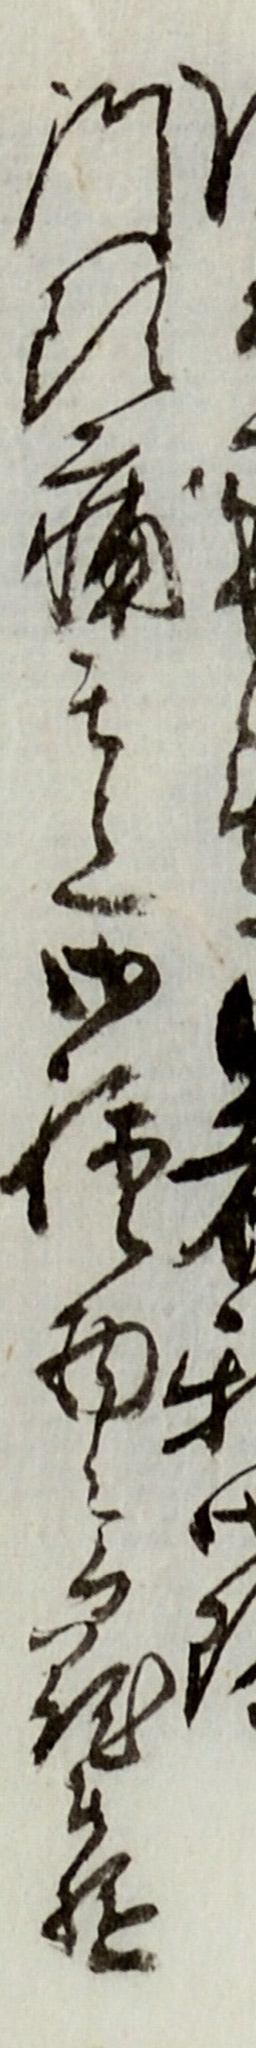御頭痛其上御腫物ニ而難被遊

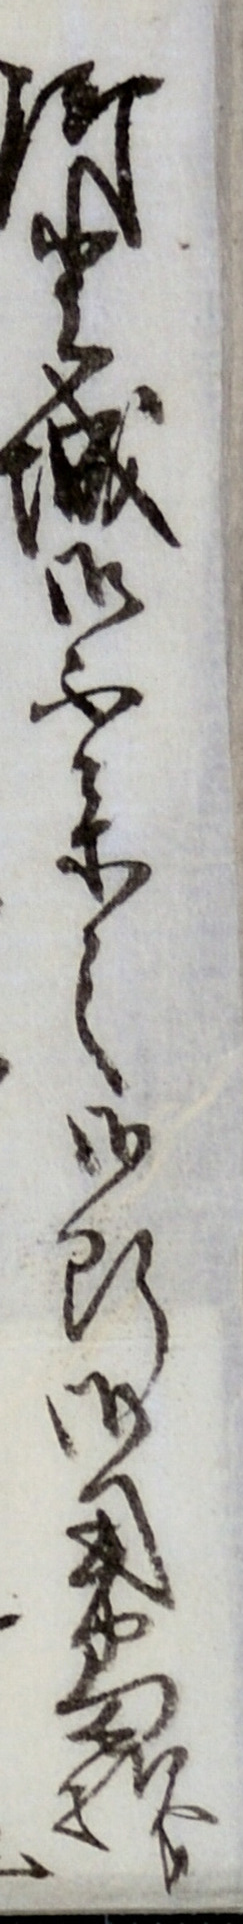御登城御不参之御断御用番様江
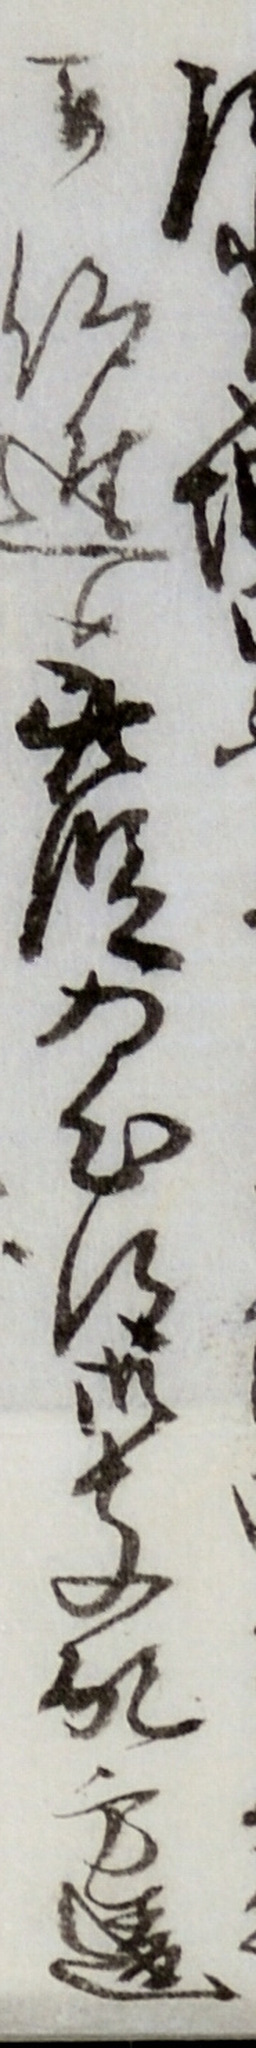被仰進候此段為心得御支配方違
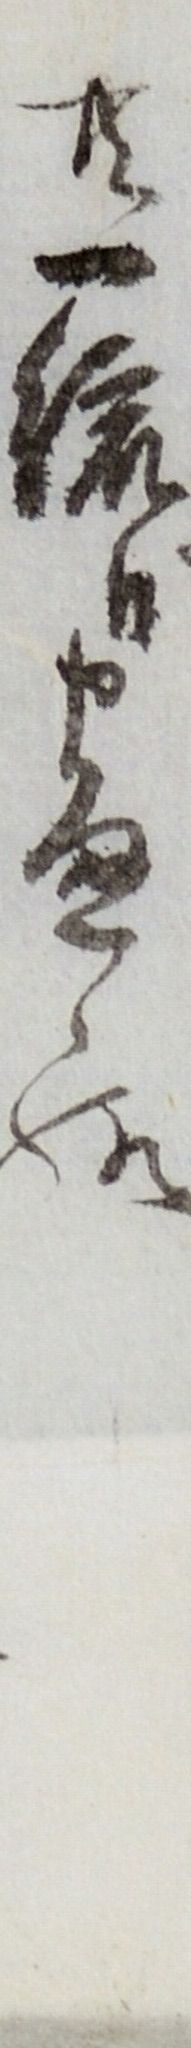共一統江申通候様
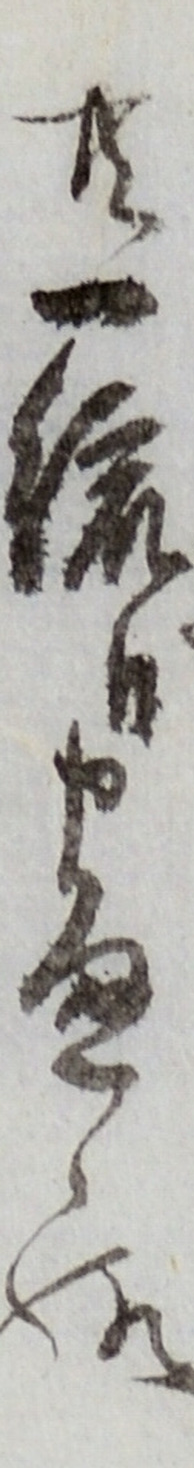共一統江申通候様
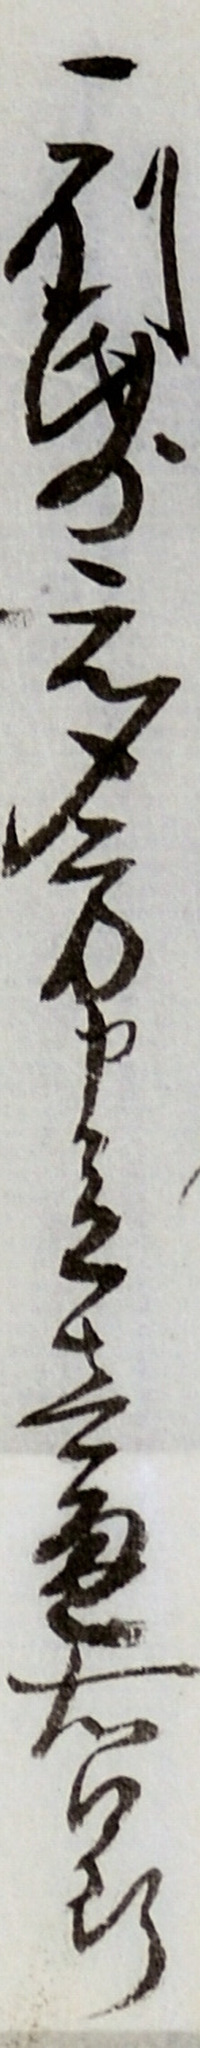一別紙元〆方申立壱通右同断
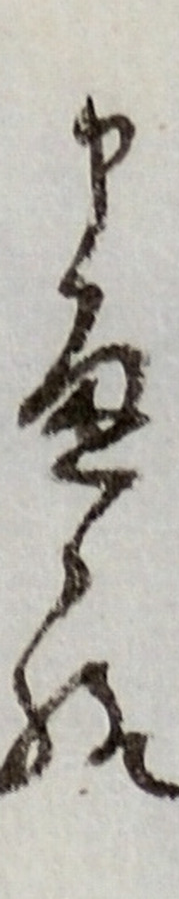申通候様
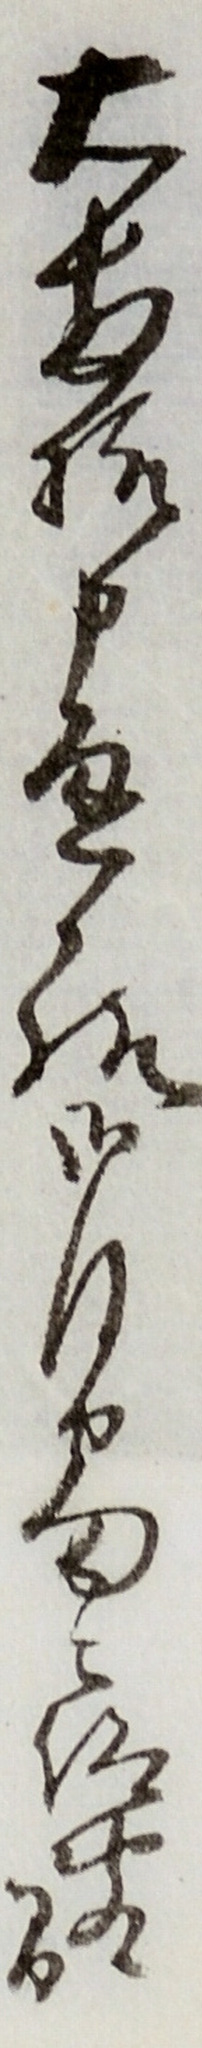右両様申通候様御月番被仰聞候間
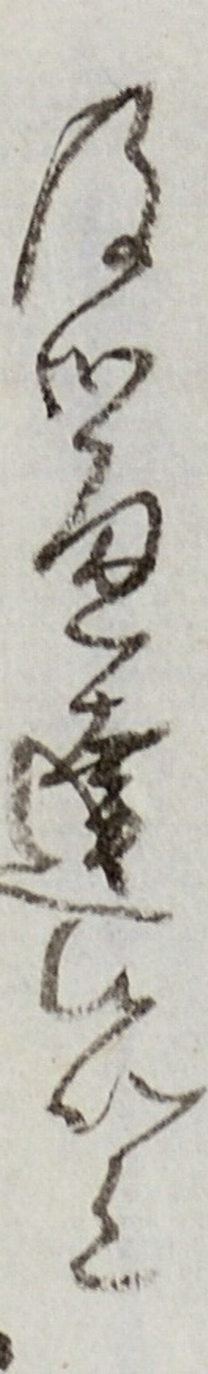及御通達候以上
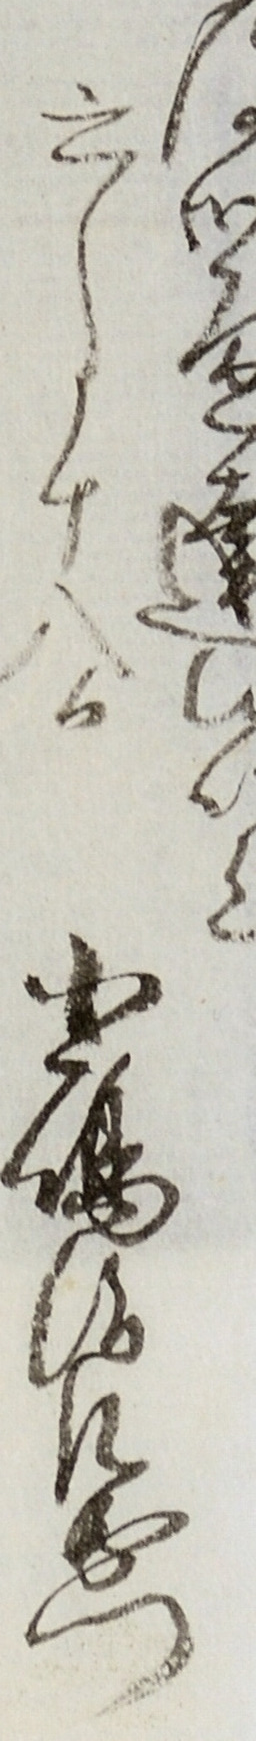六月十八日小嶋治左衛門
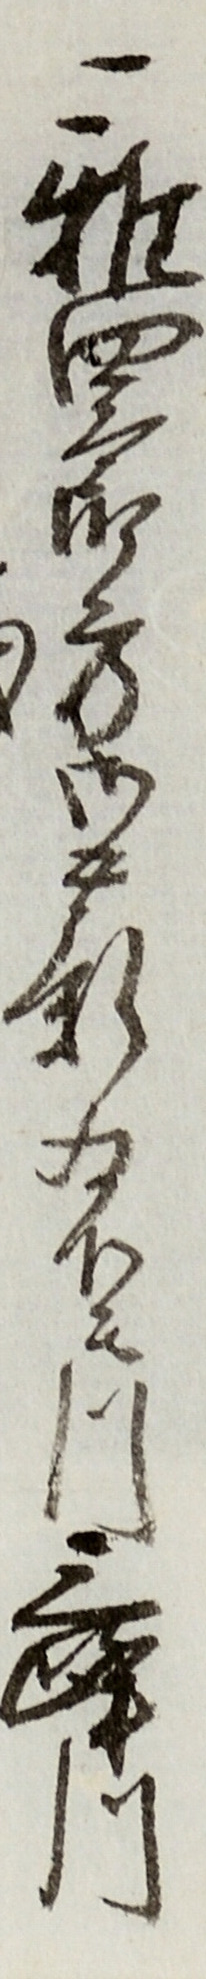一雅四郎方御薪為下モ川三峰川
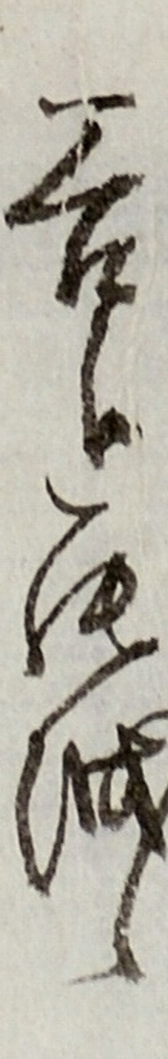谷江罷越候
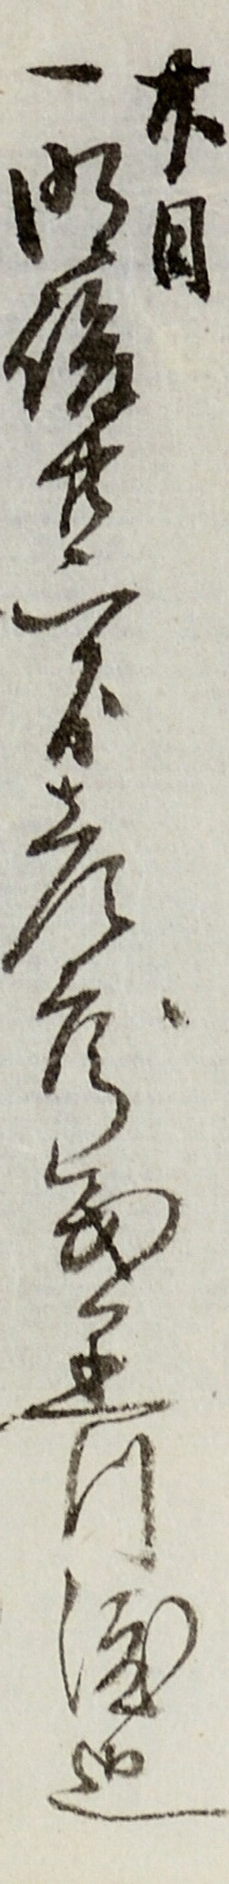一明後廿二日ゟ彦蔵義黒川渡迄
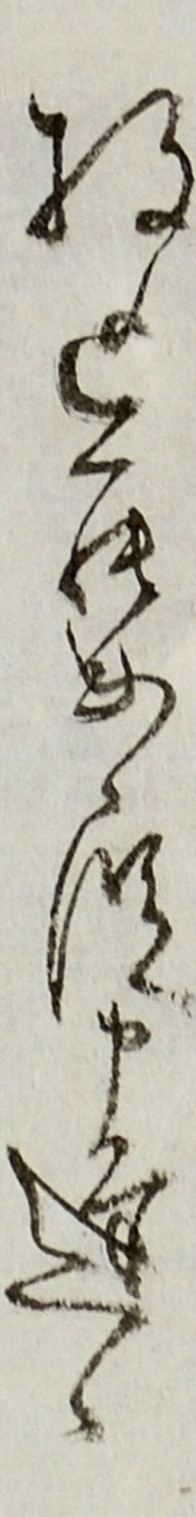投込罷出候段申達候
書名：御山方御薪方諸事御用留
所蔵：伊那市立高遠町図書館・合同会社AMANE
